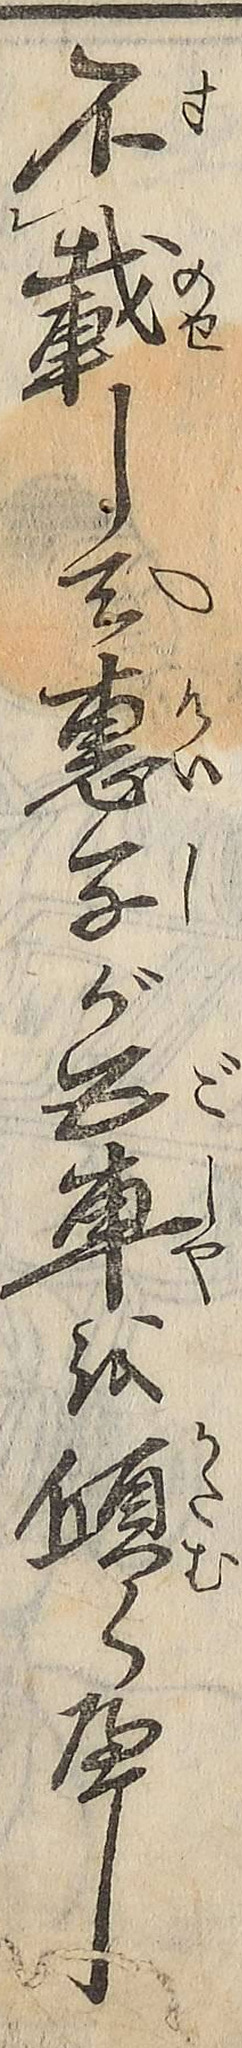不載して。恵子が五車を傾くへし
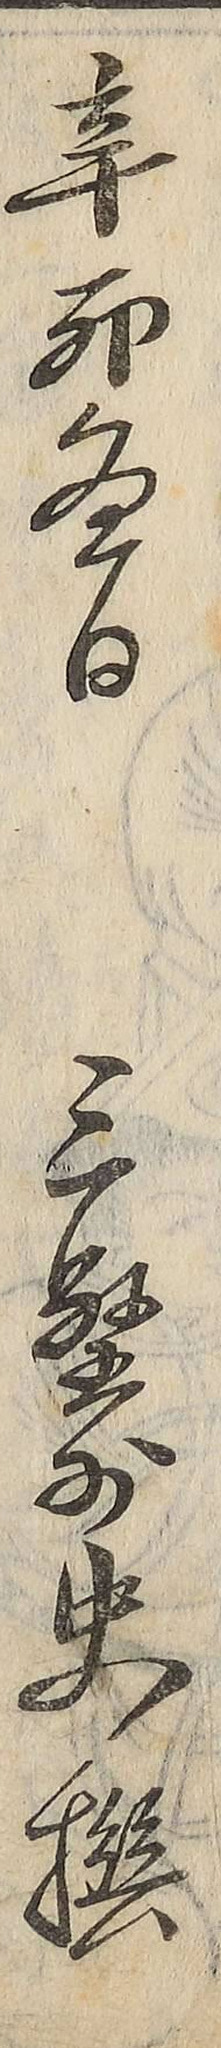辛卯冬日三璧外史撰

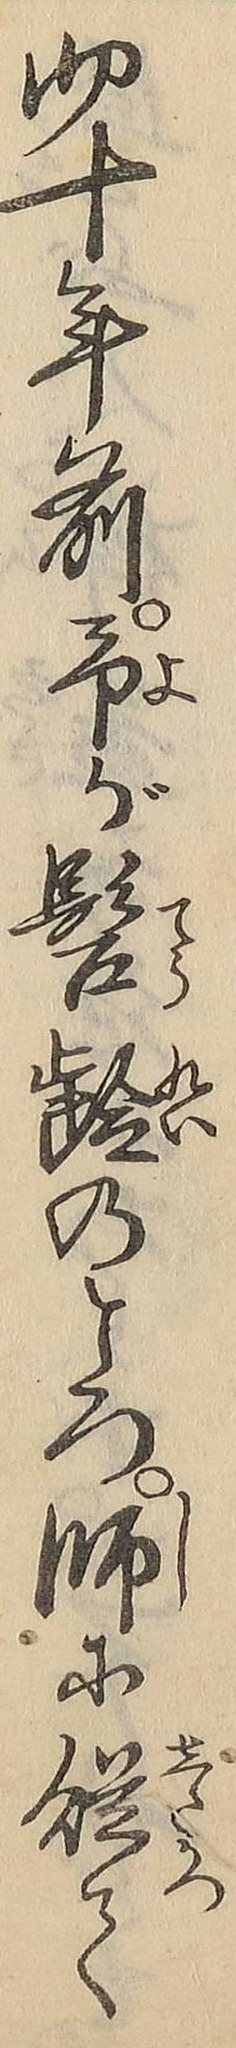四十年前。予が髫齢のころ。師に従て
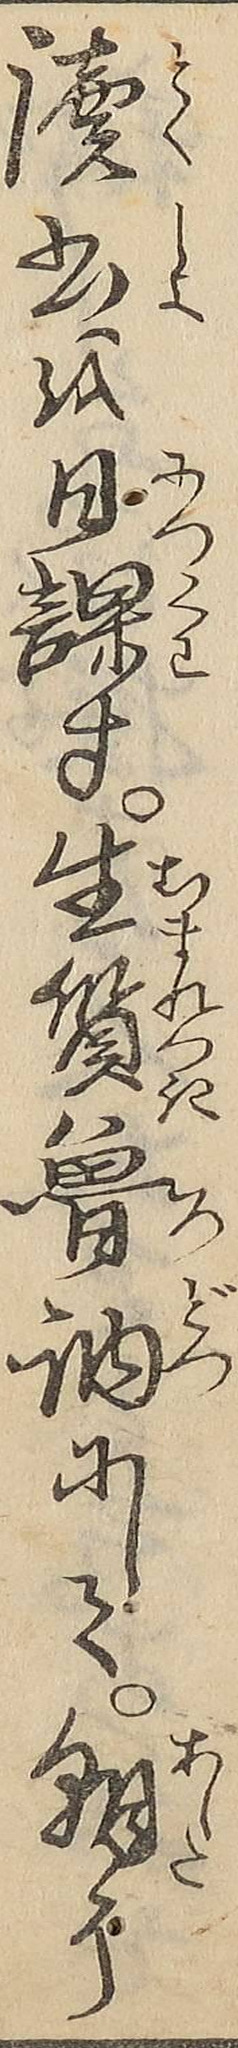読書を日課す。生質魯訥にして。朝に
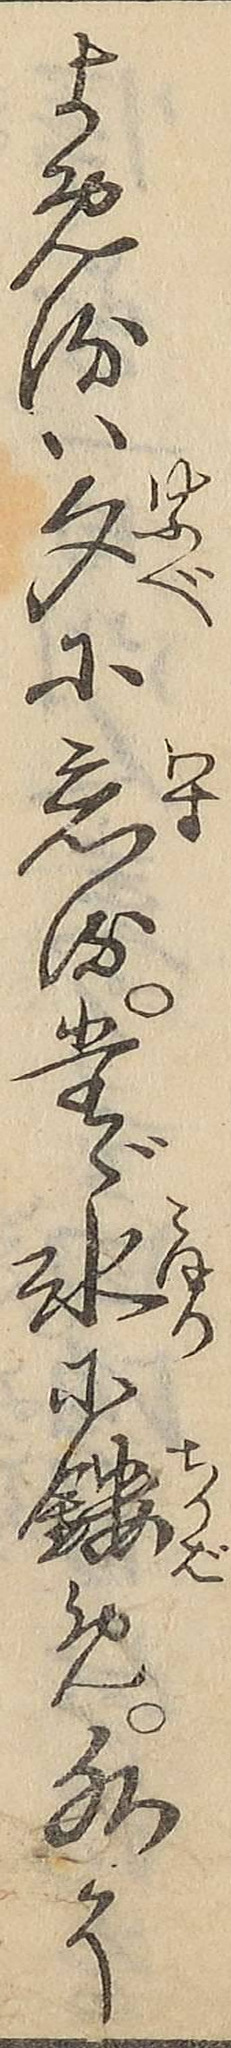よめるは夕に忘る。たゞ氷に鏤め。水に
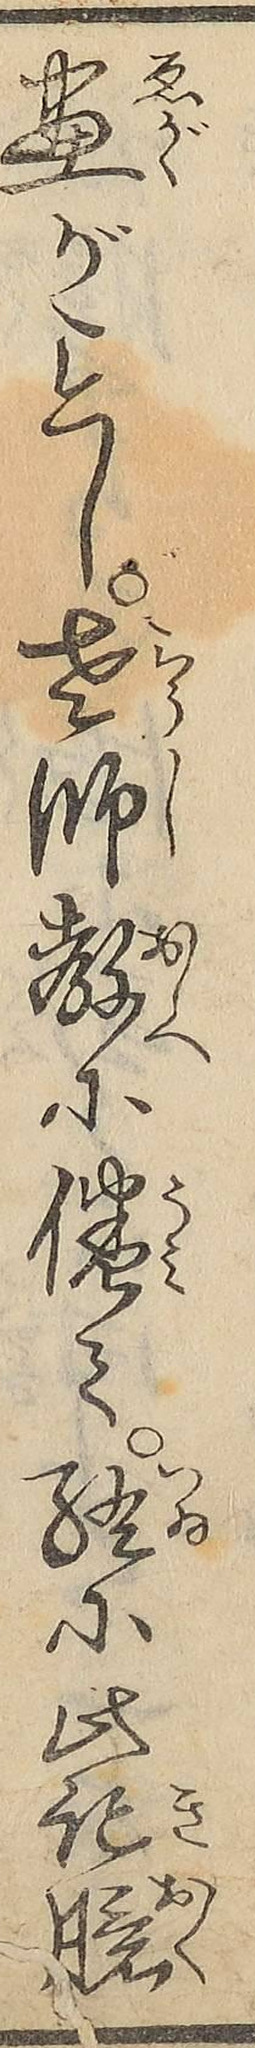画がことし。老師教に倦て。終に此記臆
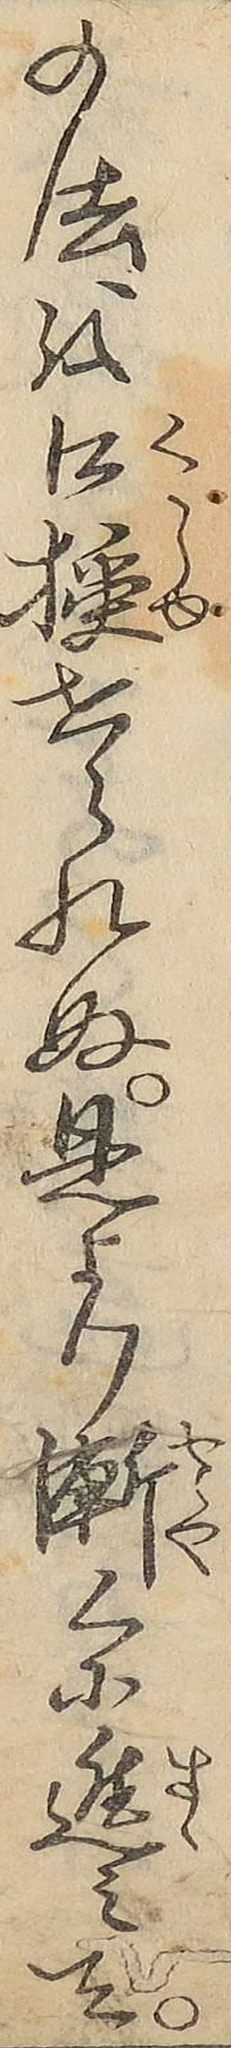の法を口授せられぬ。是より漸くに進みて。
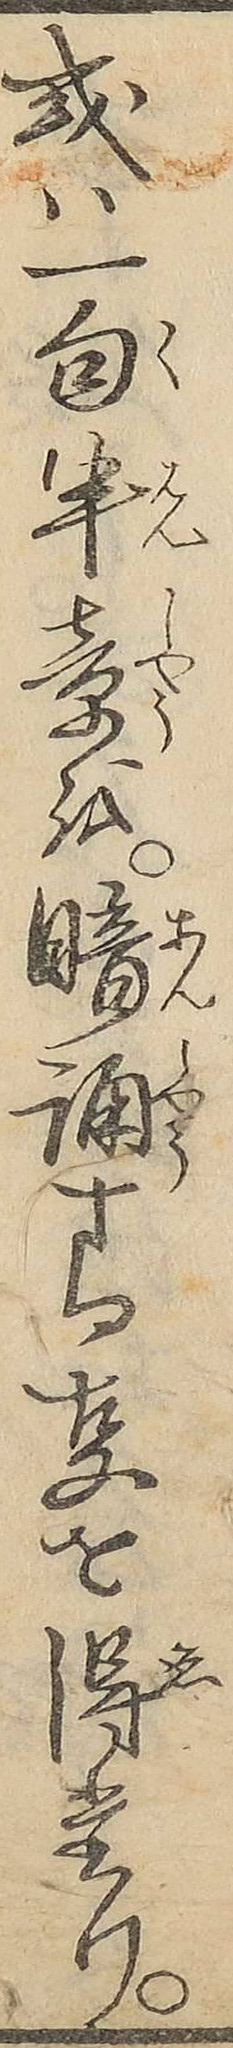或は一句半章を。暗誦する事を得たり。
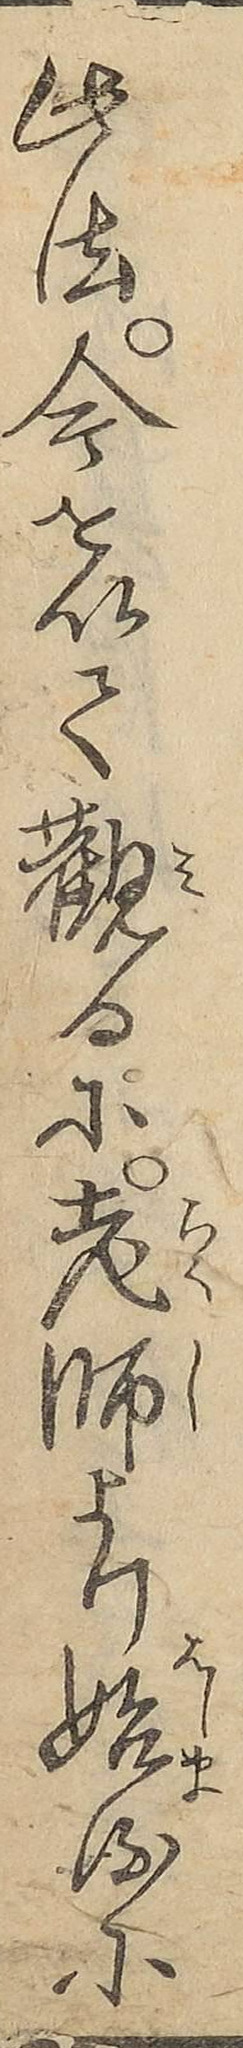此法。今を以て観るに。老師より始るに

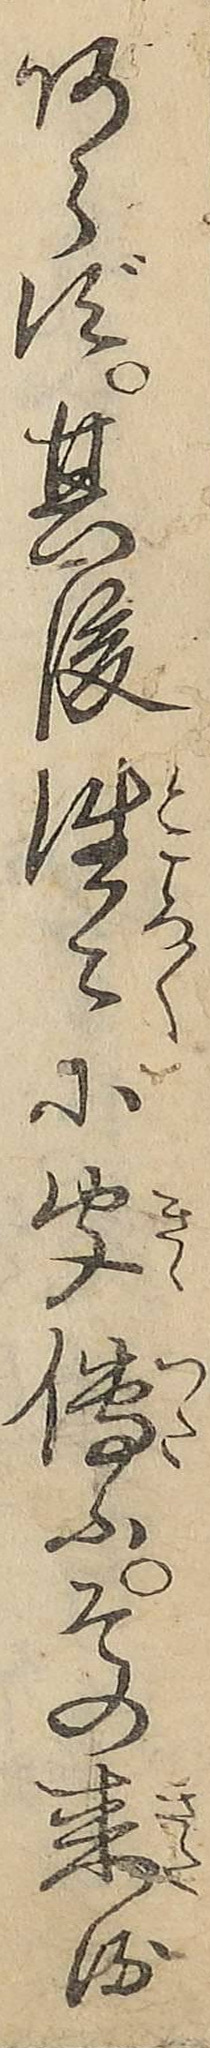あらず。其後往々に聞伝ふ。その来る
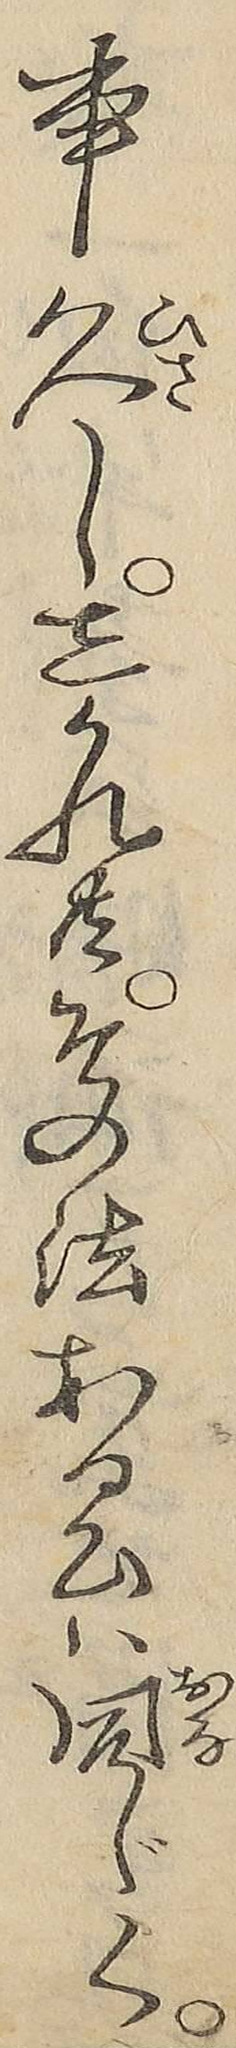事久し。しかれ共。その法あるひは同じく。
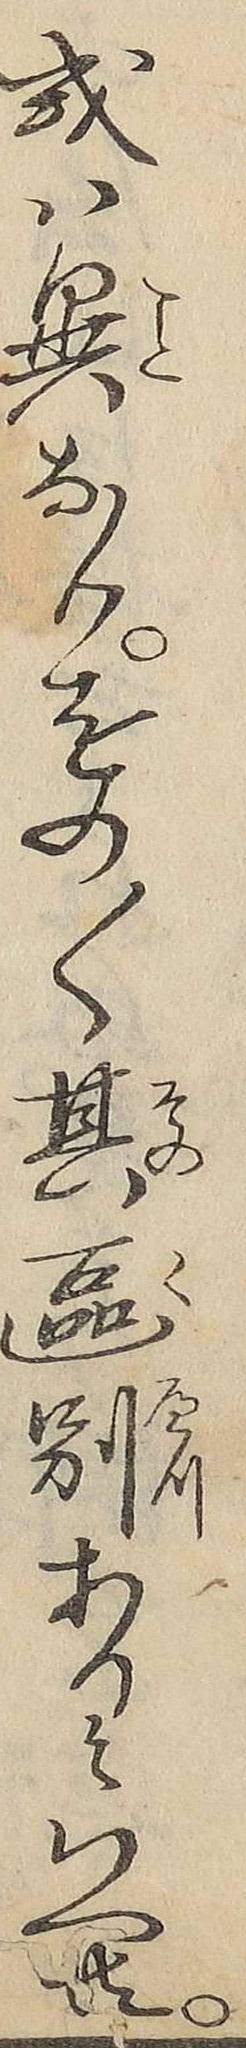或は異なり。をの〳〵其区別ありといへ共。
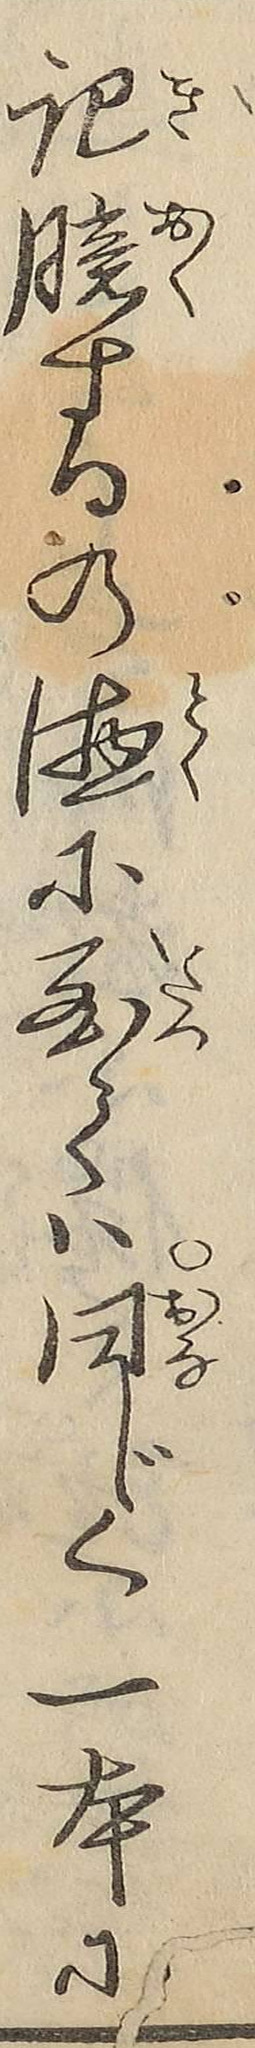記臆するの徳に至ては。同じく一本に
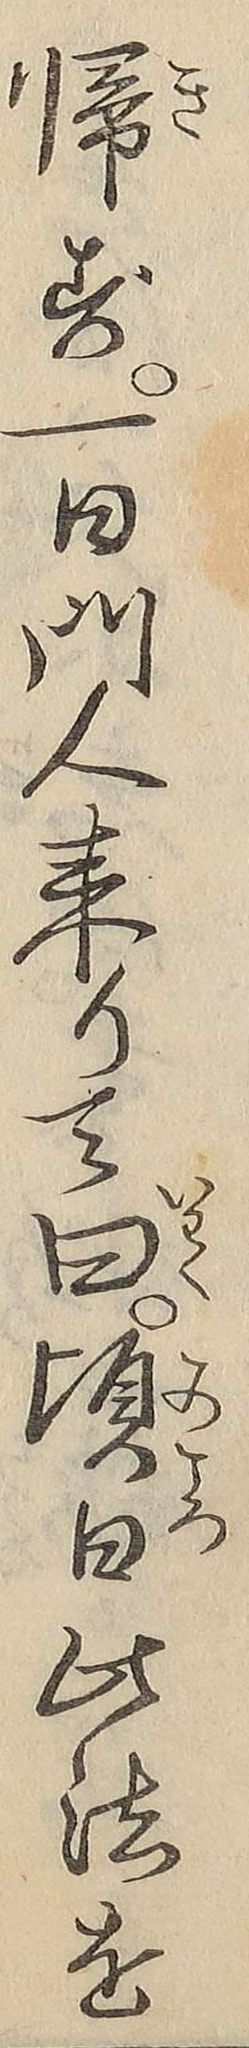帰す。一日門人来りて曰。頃日此法を
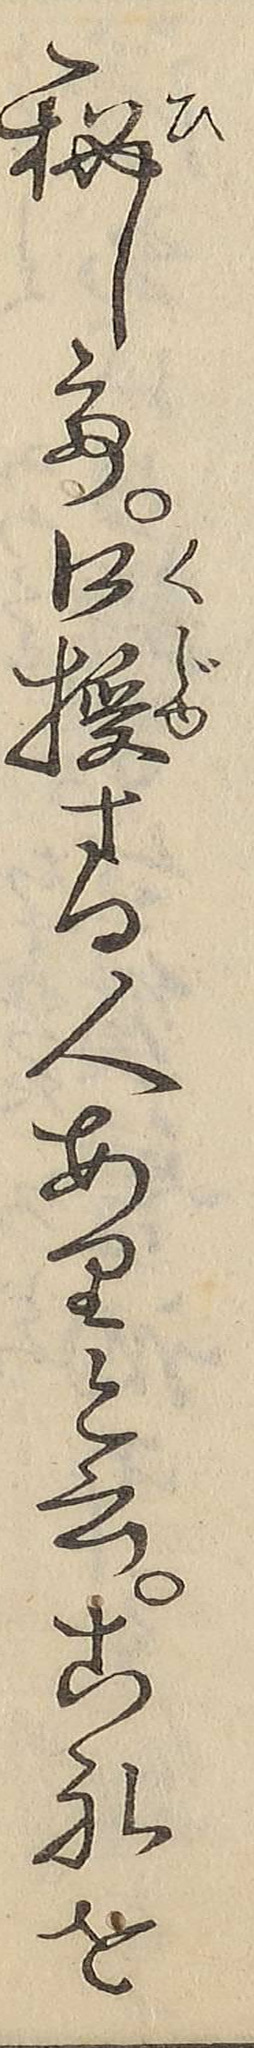秘して。口授する人ありと云。これを
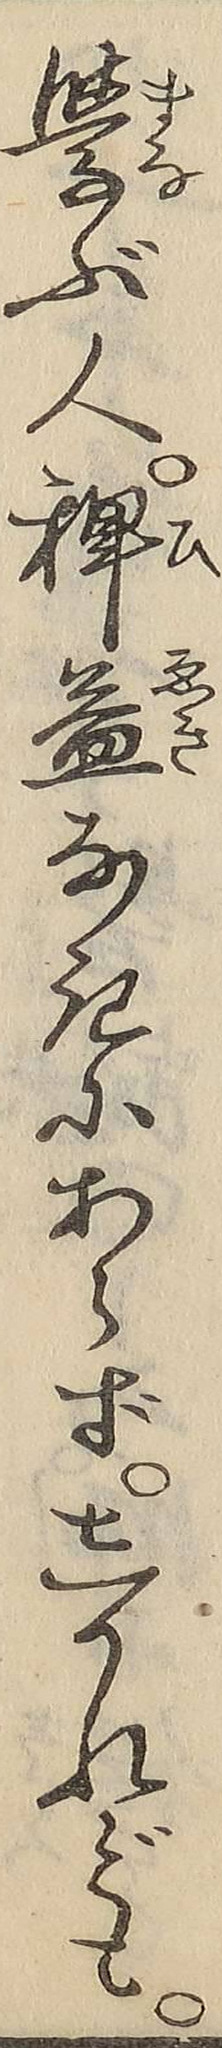学ぶ人。裨益なきにあらず。しかれども。
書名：物覺秘傳
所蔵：神戸大学附属図書館 国文学研究資料館
